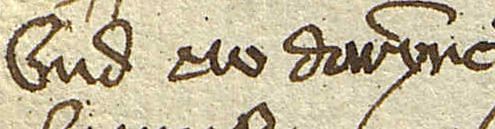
vnd ew daryne*
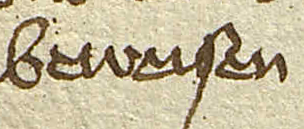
beweiſen
